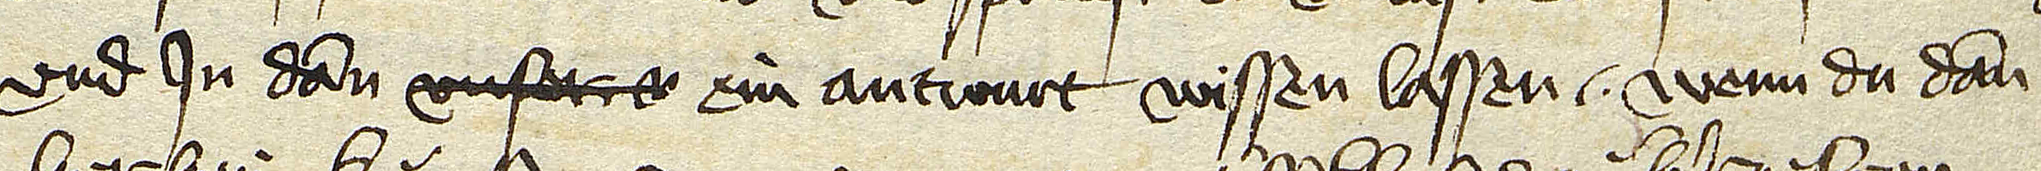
vnd In da*n vnſer r ein antwurt wiſſen laſſen / . wenn du da*n
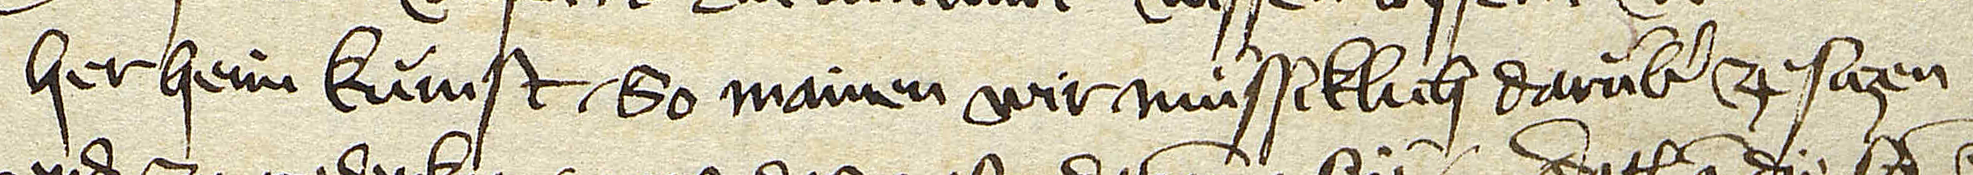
her heim kümſt / So mainen wir müſſiklich darüb* cʒeſaʒen
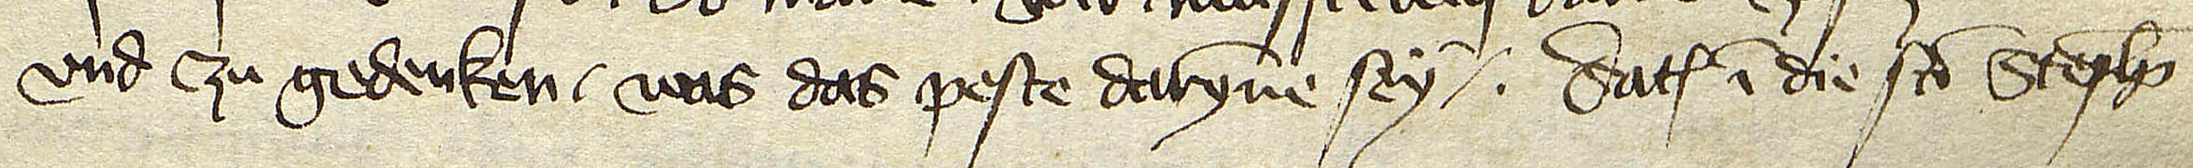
vnd cʒu gedenken / was das peſte dar*yne ſey / . Dat* i* die ſci* Stephi*
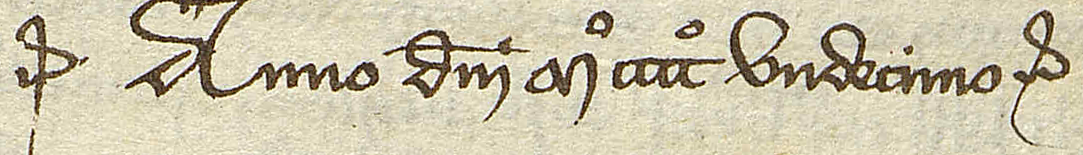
§ Anno dm* M* cccc* vndecimo §
